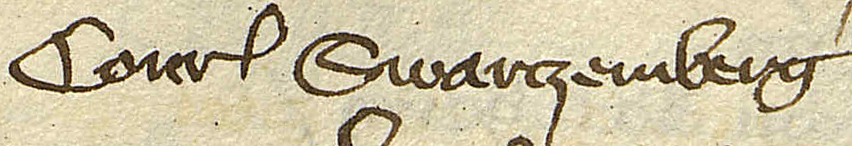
Conr* Swarcʒemberg*
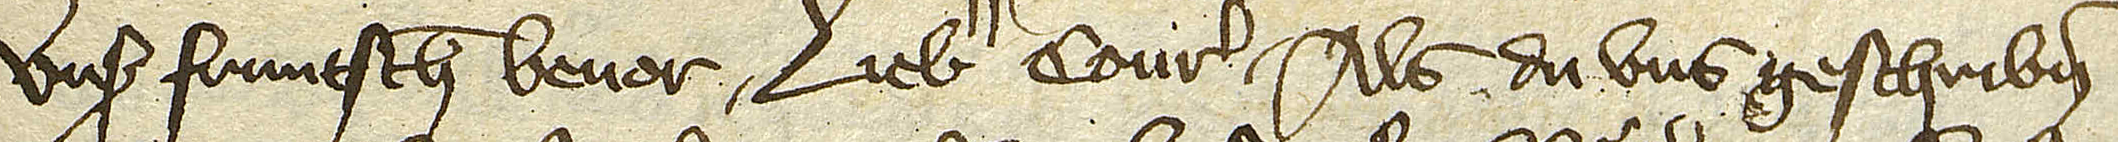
Vnſ* freuntſch* beuor / Lieb* Conr* / Als du vns geſchribn*
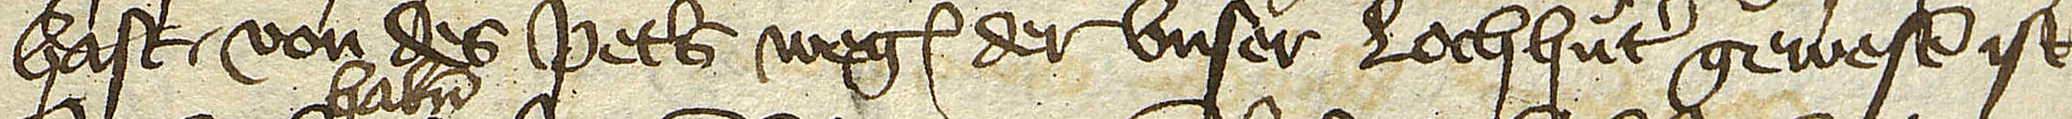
haſt / von des Pet*s weg* der vnſer Lochhüt* geweſe* iſt
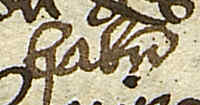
habn*
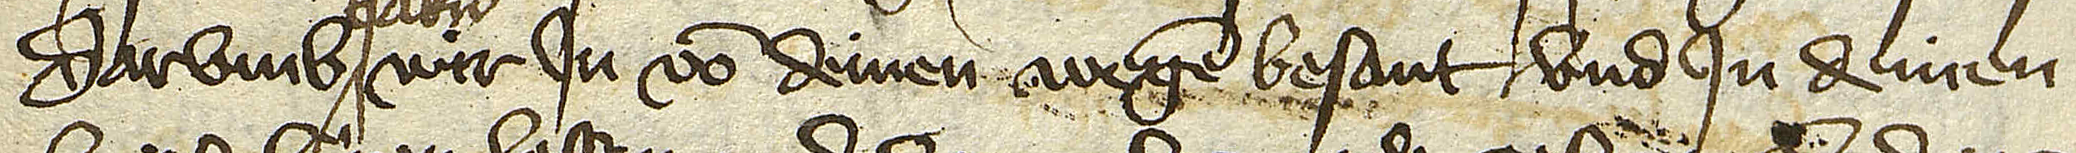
Darvmb wir In vo* deinen wege* beſant / vnd In deinen
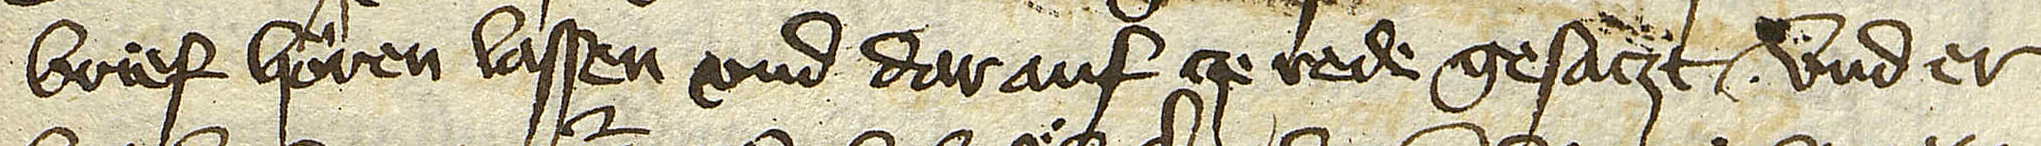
brief hören laſſen vnd dar auf cʒe rede geſacʒt / . vnd er
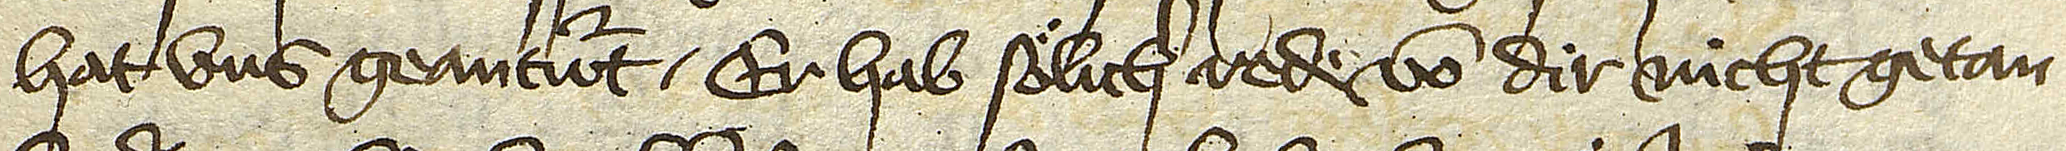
hat vns geantwt* / Er hab ſölich* rede vo* dir nicht getan
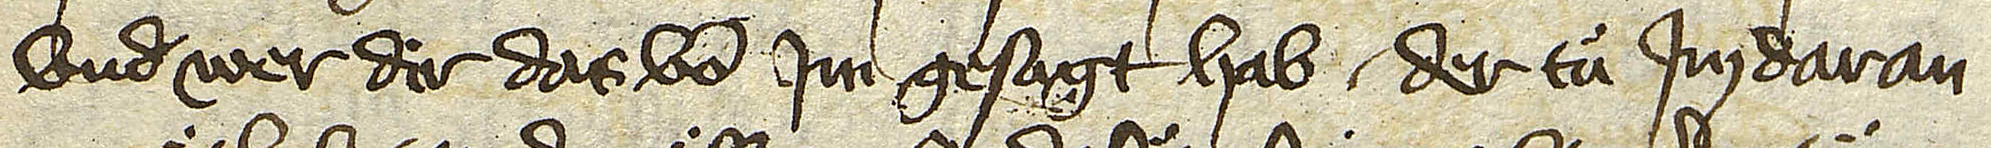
vnd wer dir das vo* Im geſagt hab / der tü Im daran
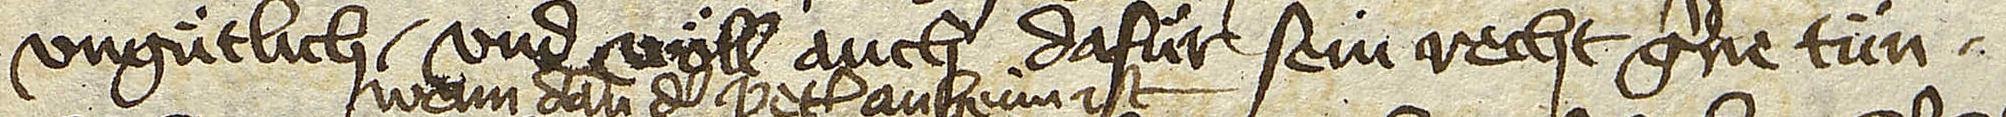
vngütlich / vnd völl auch dafür ſein recht g*ne tün /
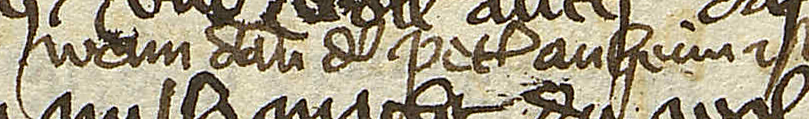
wenn dan d* Pet* anheim iſt
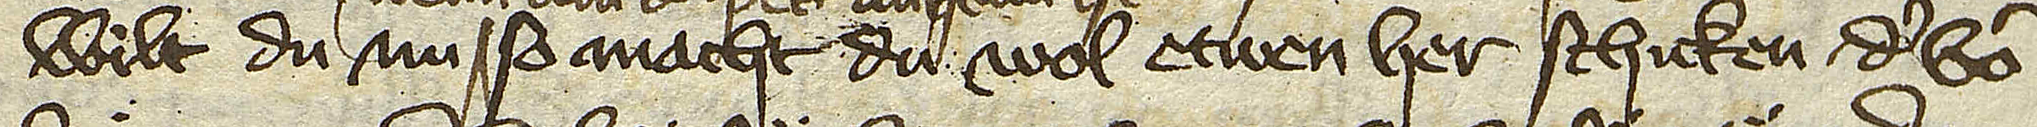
wilt du nu ſo macht du wol etwebn her ſchicken / d* vo*
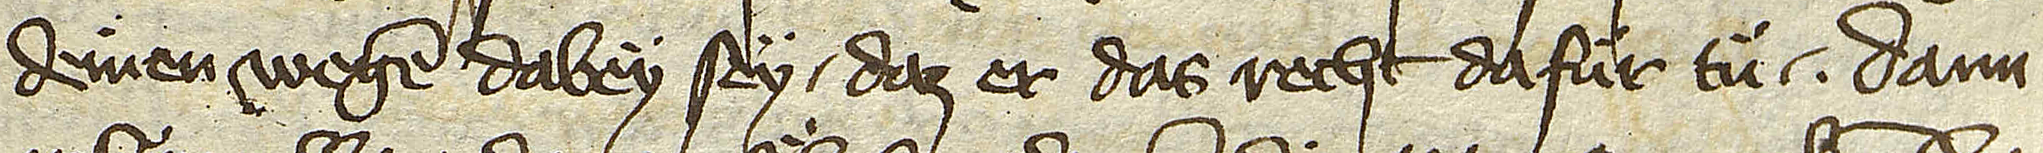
deinen wege* dabey ſey / daʒ er das recht dafür tü / . dann
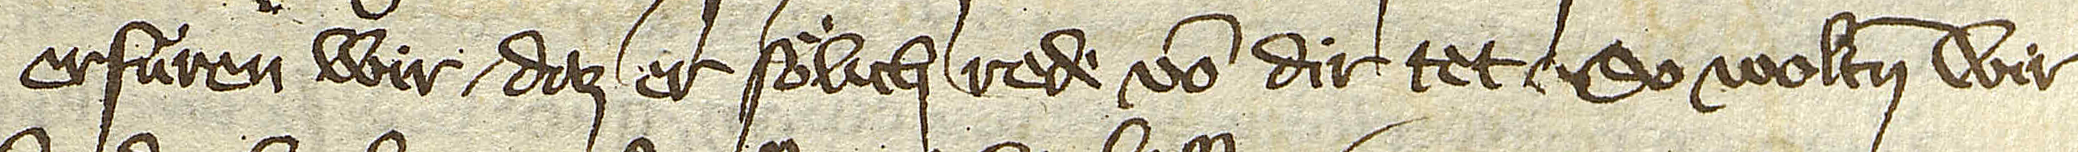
erfüren wir / daʒ er ſölich rede vo* dir tet / So woltn* wir
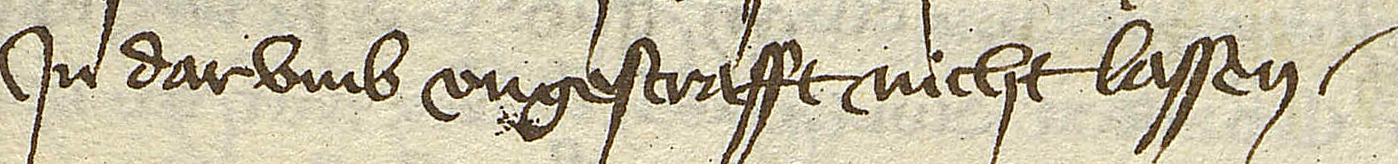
In darvmb vngeſtrafft nicht laſſen /
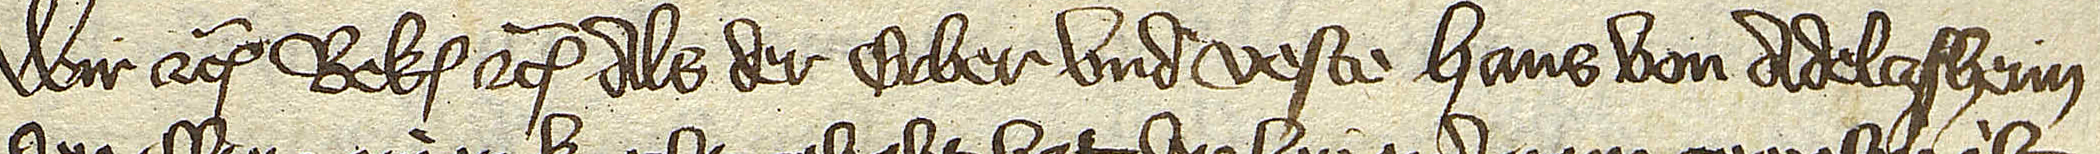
Wir ec* Bek* ec* Als der Erber vnd veſte hans von Adelcʒſheim
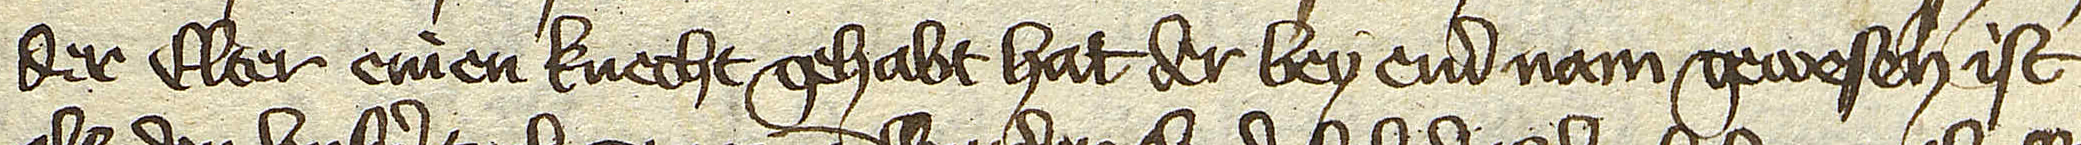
der Elter einen knecht gehabt hat der bey ein* nam geweſen iſt
